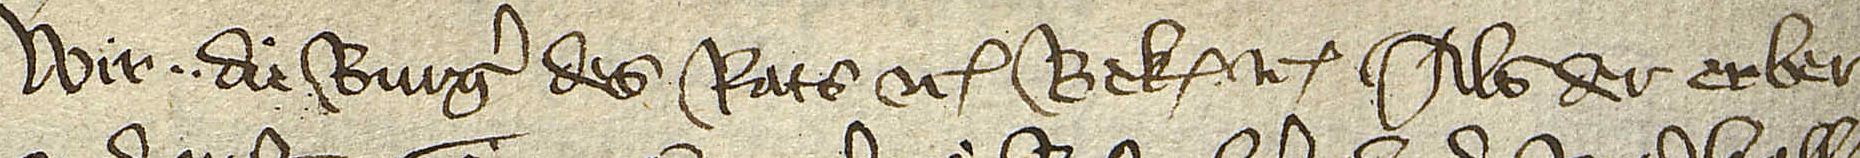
Wir ~ dieBurg* des Rats ec* Bek* ec* / Als der erber
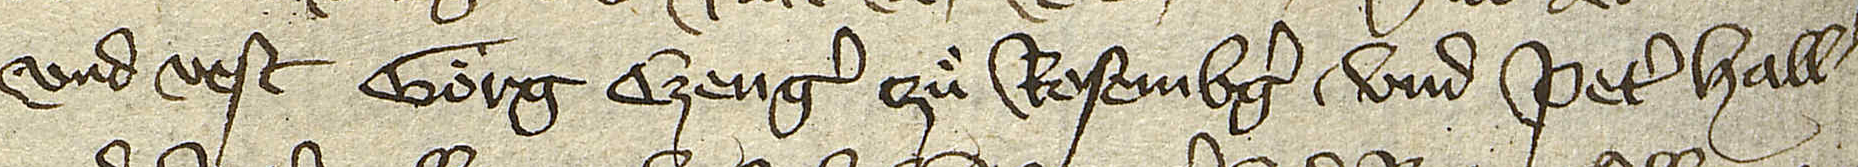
vnd veſt Görg Cʒeng* cʒü Roſemb*g / vnd Pet* Hall*
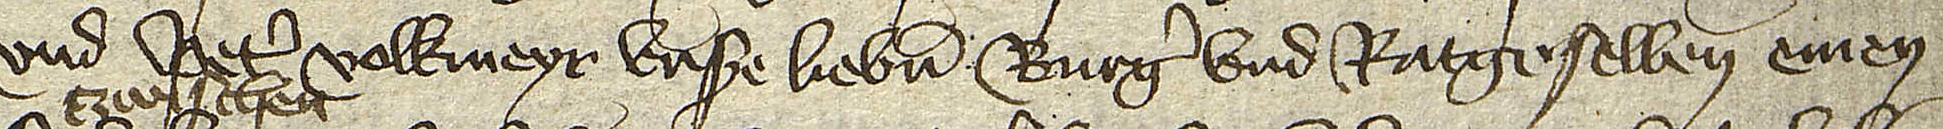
vnd Pet* volkmeyr vnſ*e liebn* Burg* vnd Ratgeſellen einen
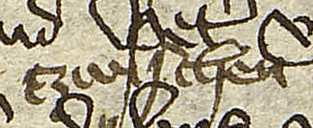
cʒwiſchen
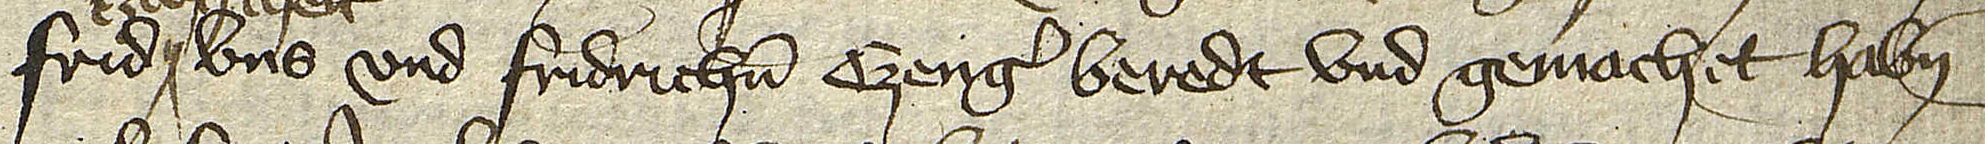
frid vns vnd fridrichn* Cʒeng* beredt vnd gemachet habn*
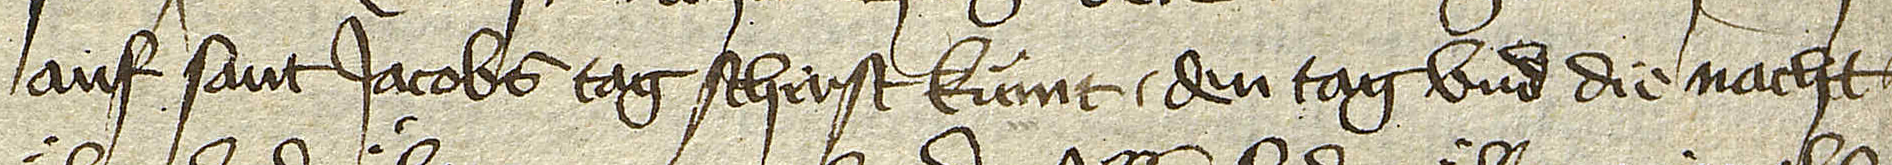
auf ſant Iacobs tag ſchirſt kümt / den tag vnd die nacht
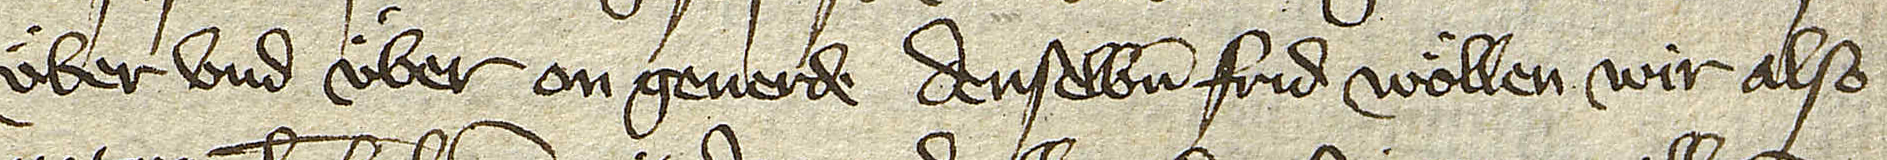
v̈ber vnd v̈ber on geuerde denſelbn* frid wöllen wir alſo
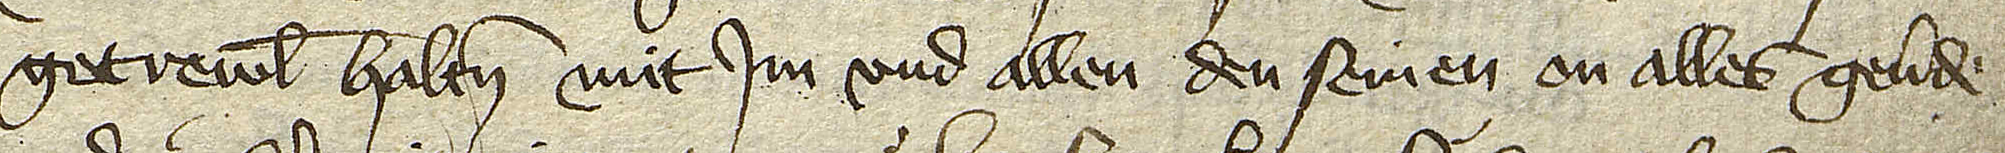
getrewl* haltn* mit Im vnd allen den ſeinen on alles geu*de
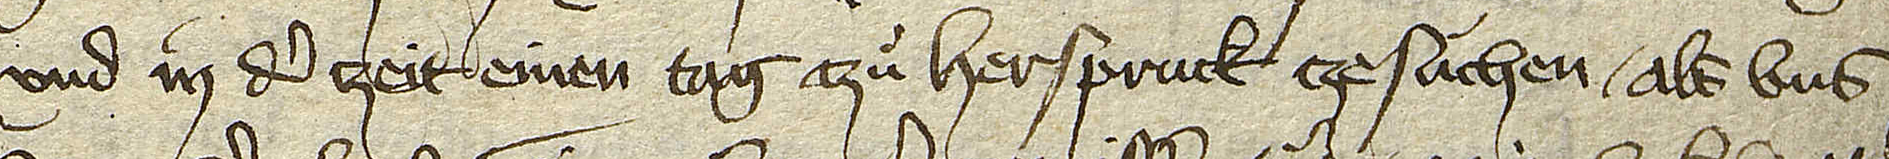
vnd in d* cʒeit einen tag cʒü Herſpruck cʒeſüchen / als vns
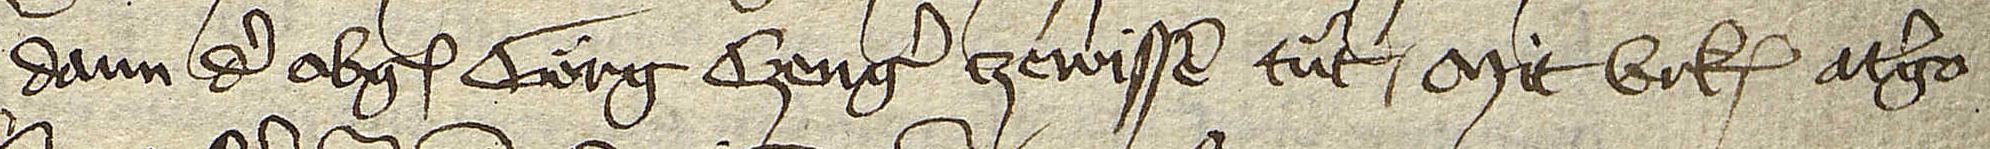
dann d* obg* Görg Cʒeng* cʒwiſſe* tüt / Mit vrk* at*go
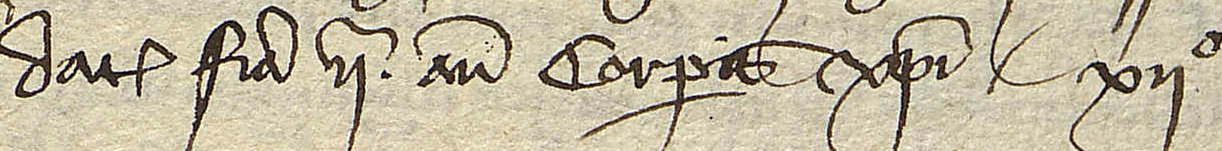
dat* fia* ii*. an* Corp*is xpi* / xii*
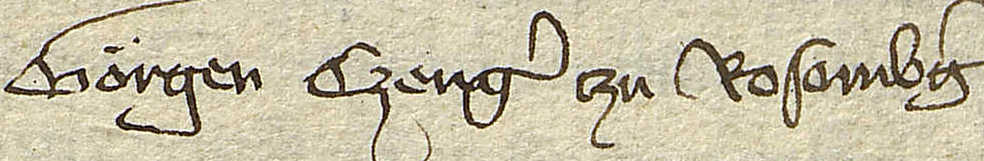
Görgen Cʒeng* cʒu Roſemb*g
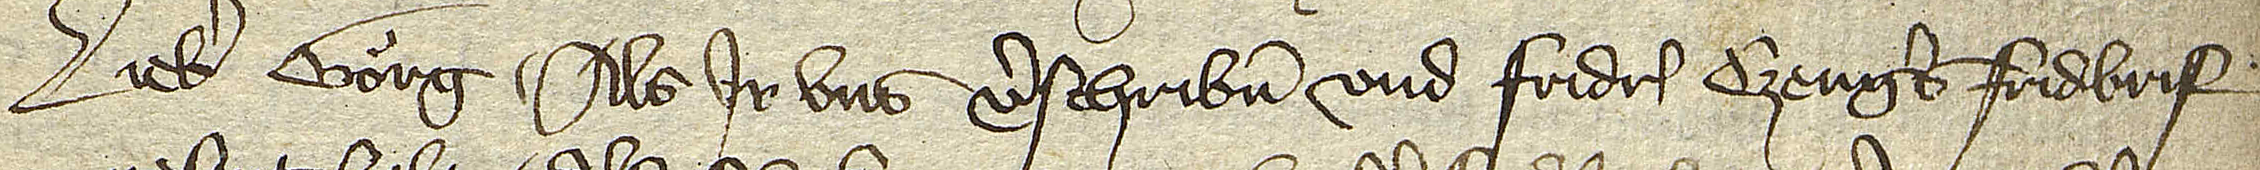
Lieb* Görg / Als Ir vns v*ſchribn* vnd fridr* Cʒeng*s fridbrif
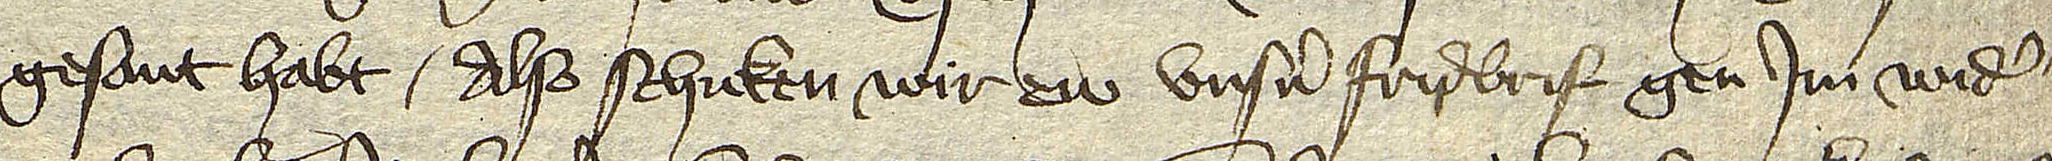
geſant habt / Alſo ſchicken wir ew vnſn* fridbrif gen Im wid*
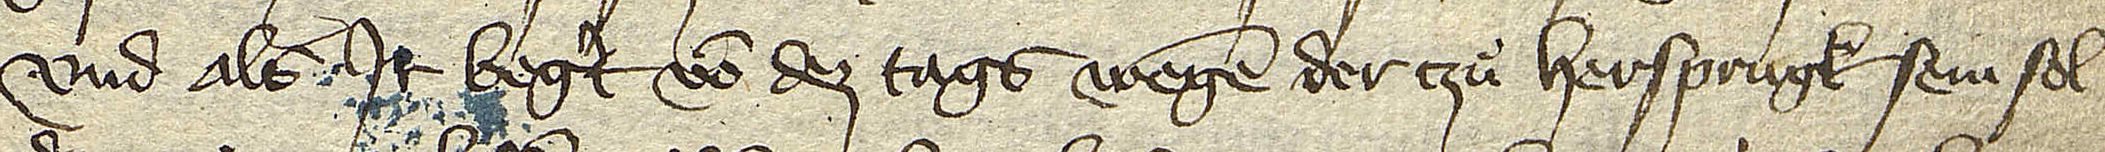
vnd als Ir beg*t vo* deʒ tags wege* der cʒü herſprugk* ſein ſol
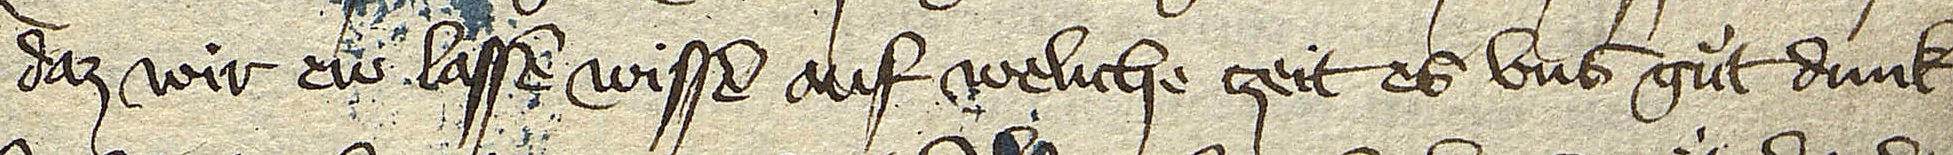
daʒ wir ew laſſe* wiſſe* auf weliche cʒeit es vns güt dunk
